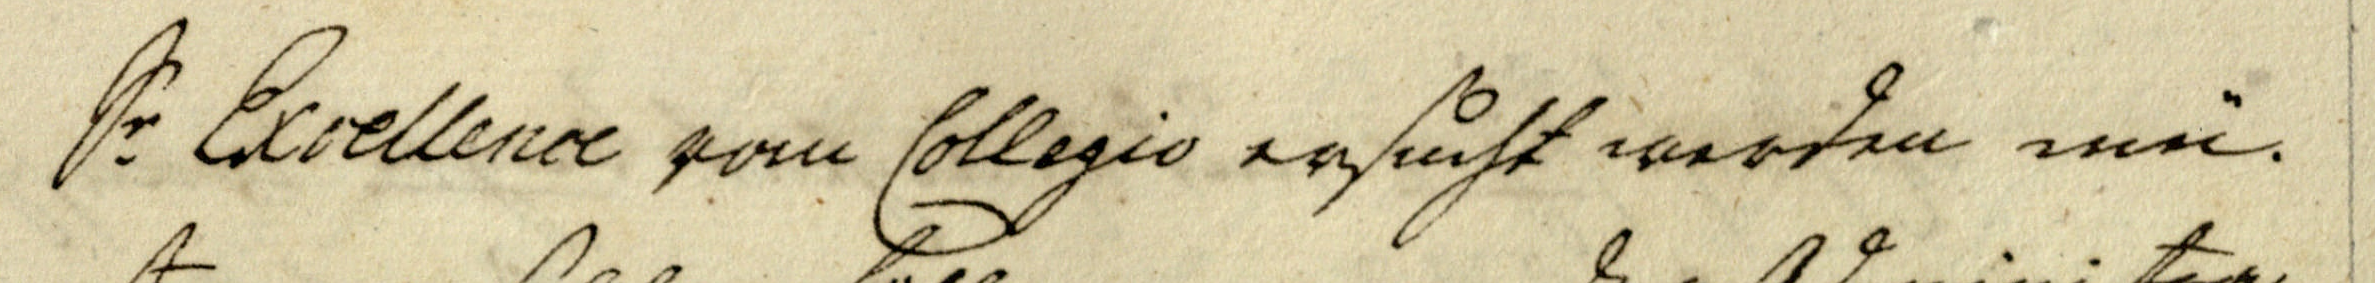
Sr Excellence vom Collegio ersucht werden mü
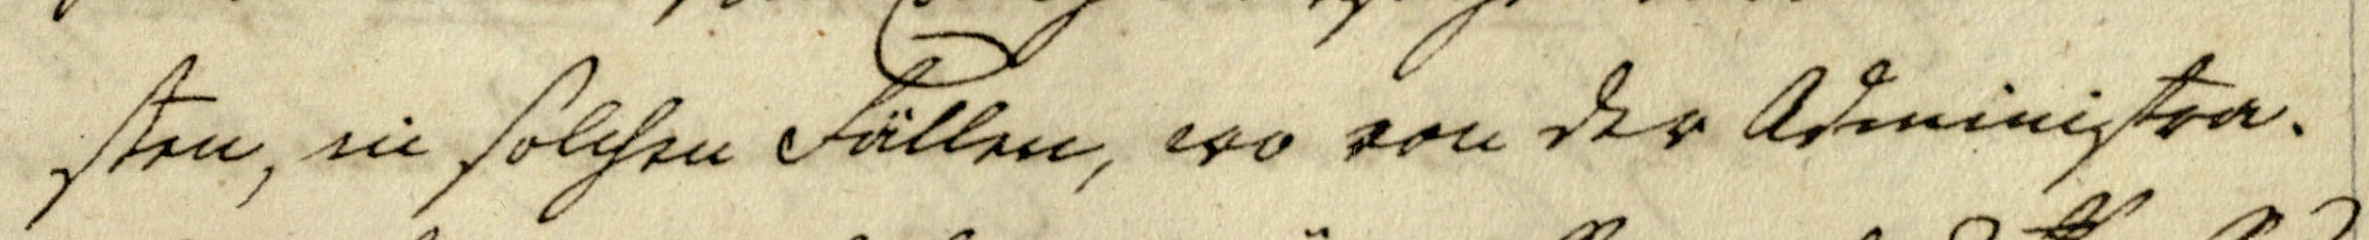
sten, in solchen Fällen, wo von der Administra¬
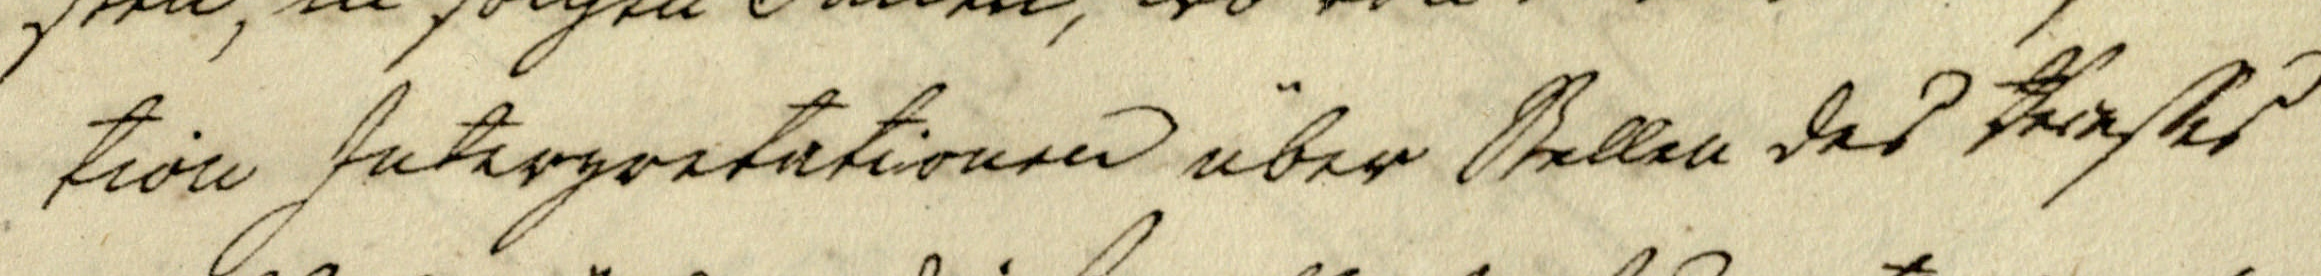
tion Interpretationen über Stellen des Recesses
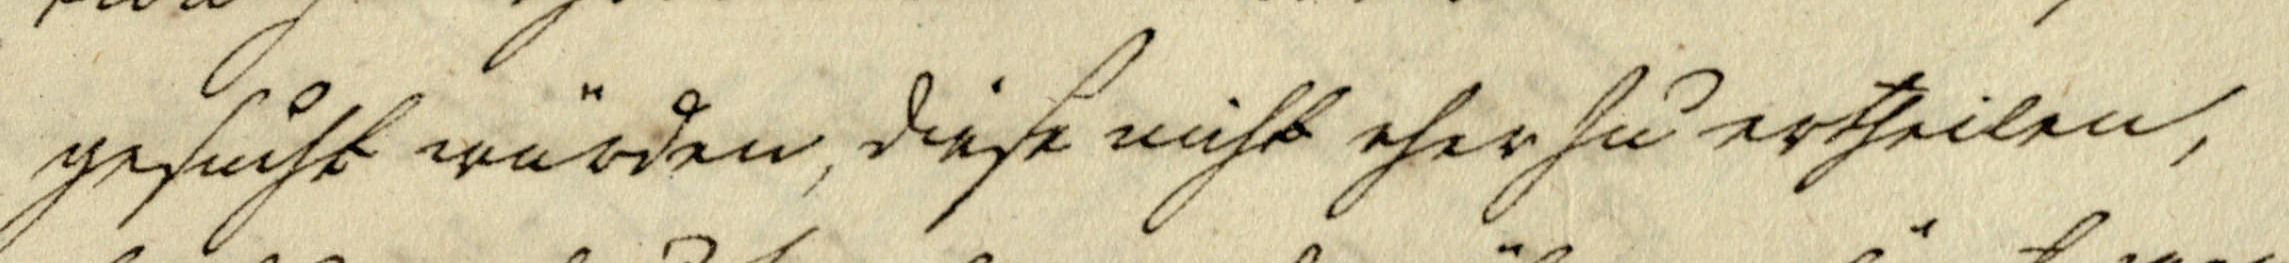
gesucht würden, diese nicht eherzu ertheilen,
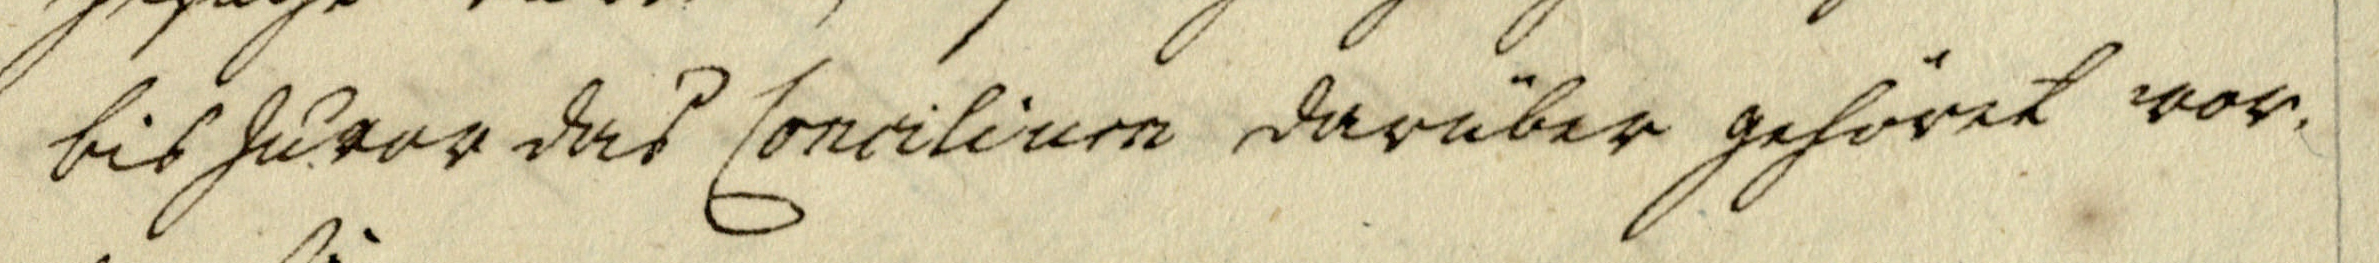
bis zuvor das Concilium darüber gehöret wor¬
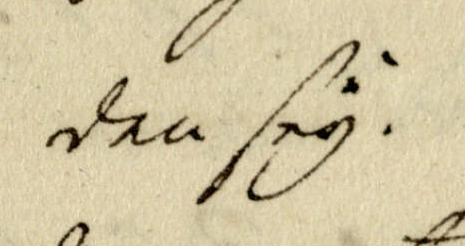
den seÿ.
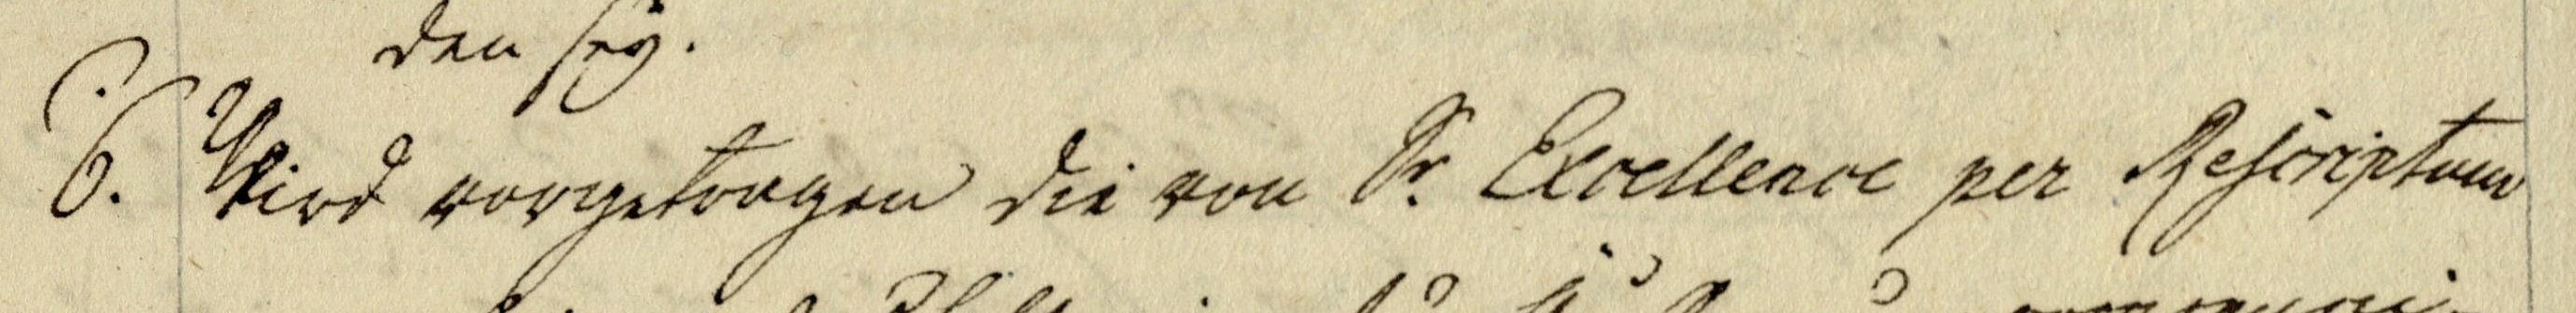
6. Wird vorgetragen die von Sr Excellence per Rescriptum
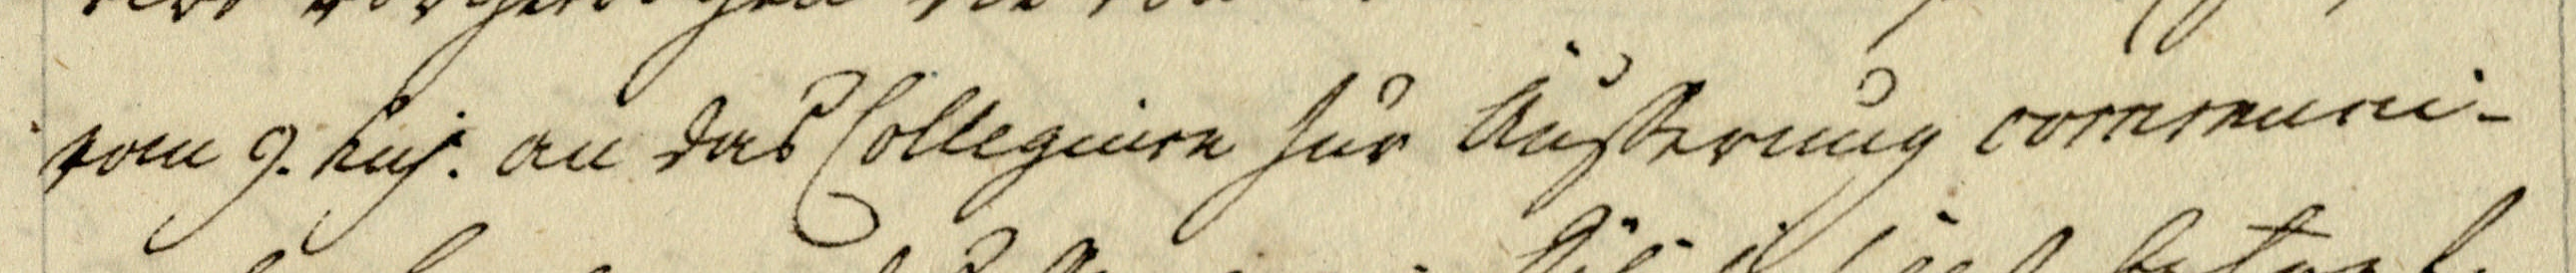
vom 9. huj. an das Collegium zur Äusserung communi¬
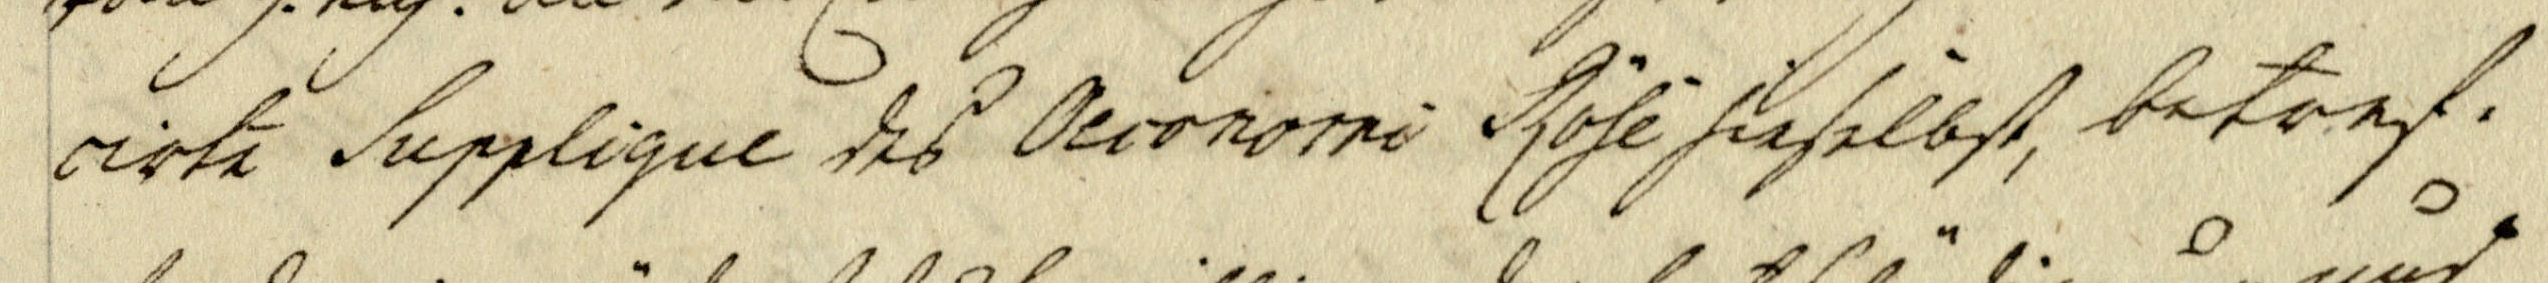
cirte Supplique des Oeconomi Röse hieselbst, betref¬
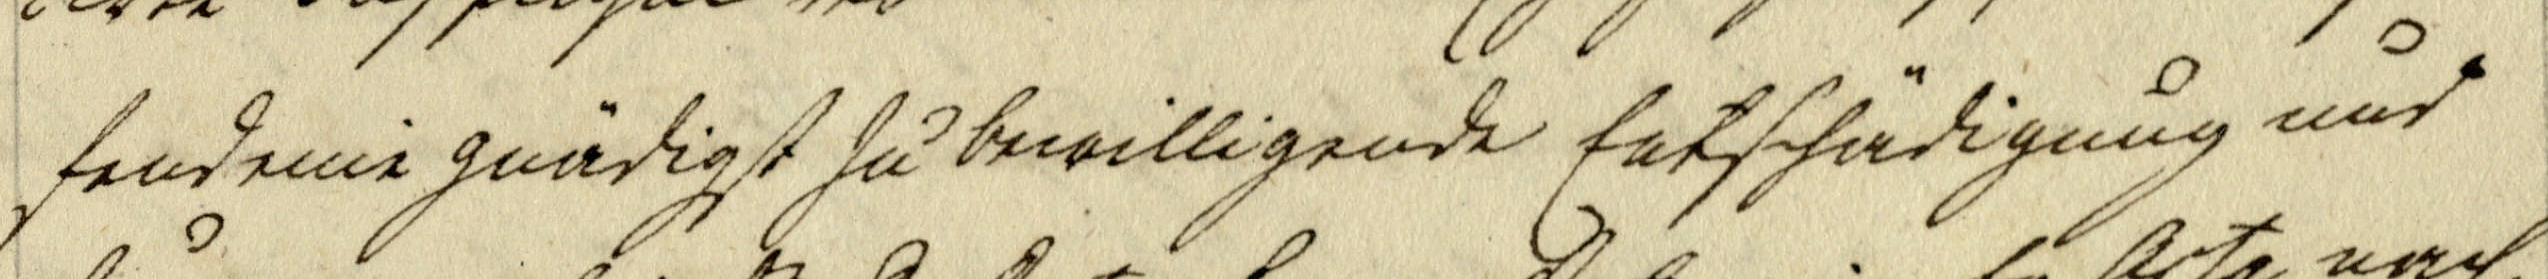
fend eine gnädigst zu bewilligende Entschädigung und
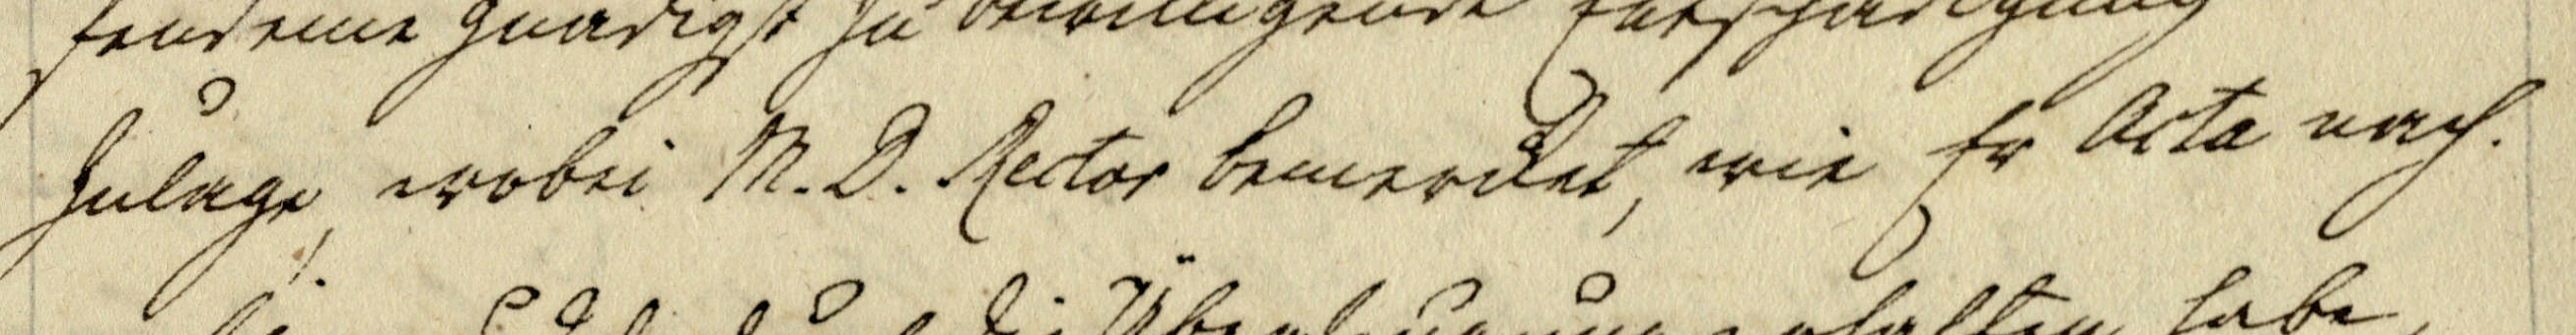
Zulage, wobei M. D. Rector bemercket, wie Er Acta nach¬
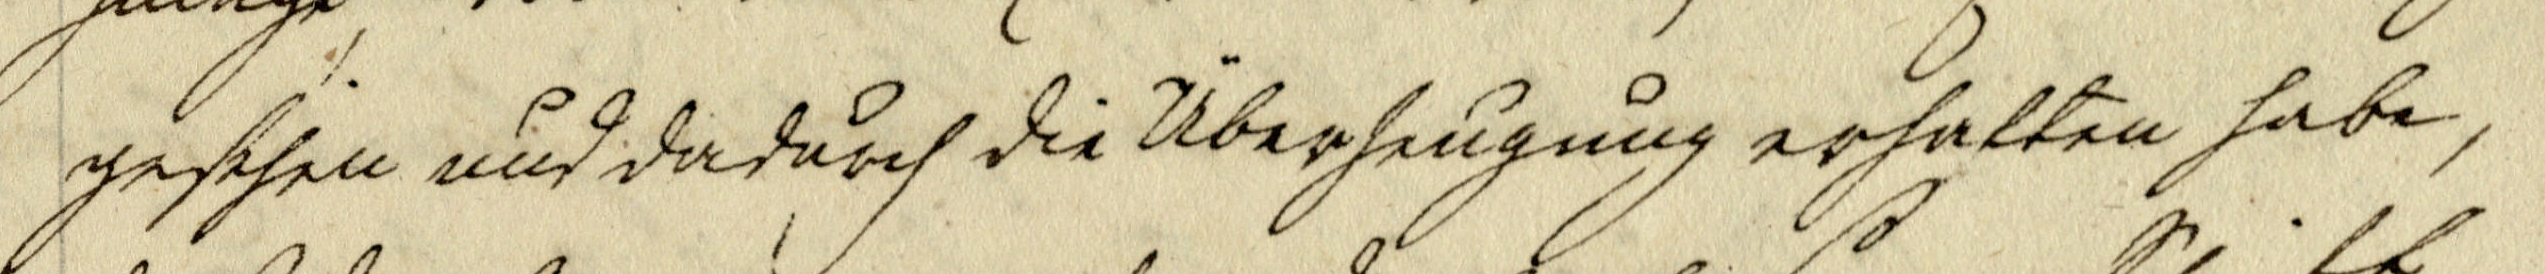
gesehen und dadurch die Überzeugung erhalten habe,
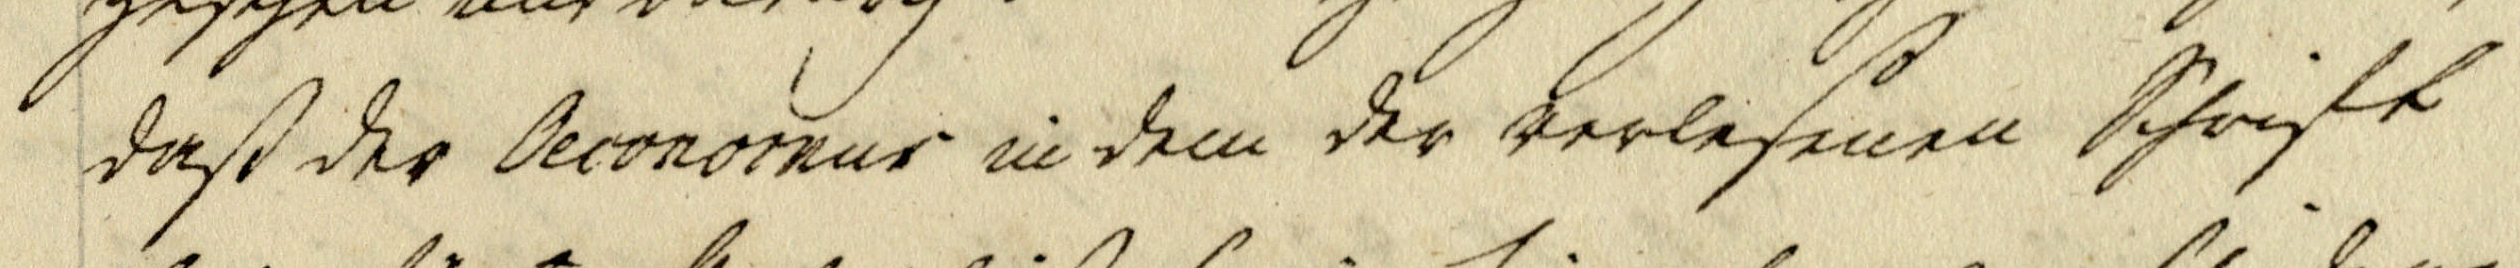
daß der Oeconomus in dem der verlesenen Schrift
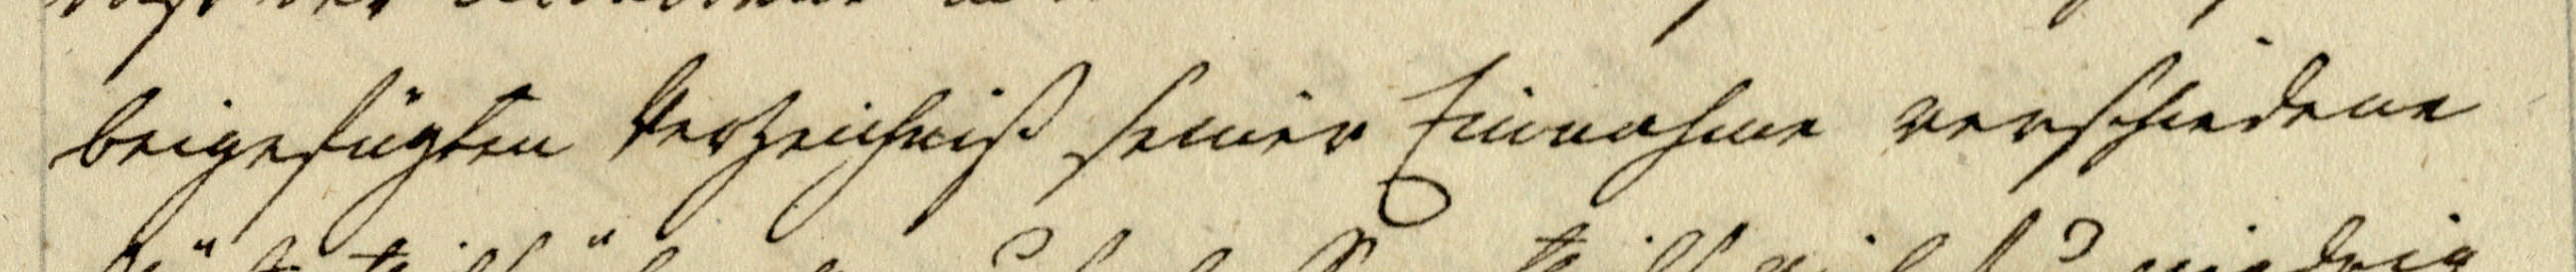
beigefügten Verzeichnis seiner Einnahme verschiedene
